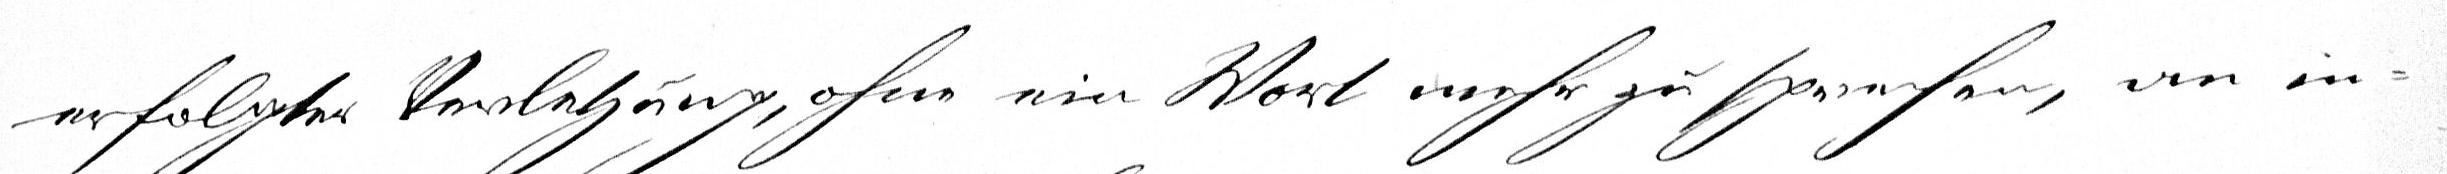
erfolgter Verletzung, ohne ein Wort wehr zu sprechen, an in¬
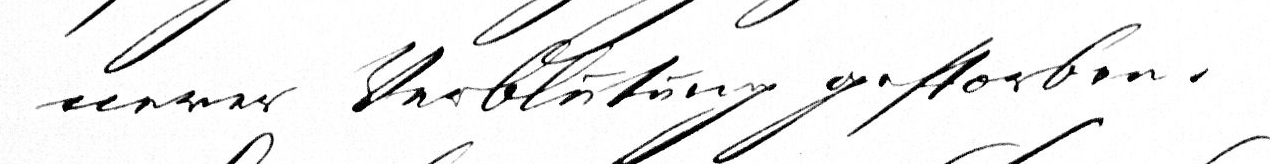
nerer Verblutung gestorben.
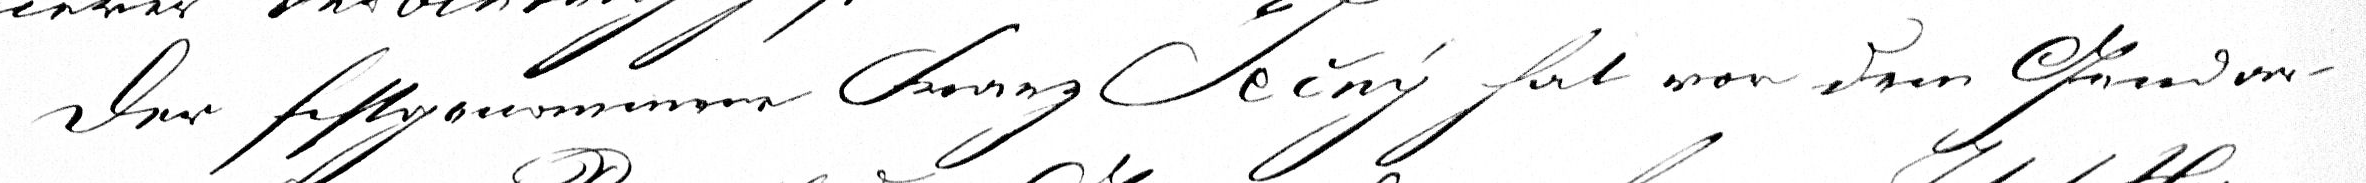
Der schegenommene Franz Jecný hat vor dem Gendar¬
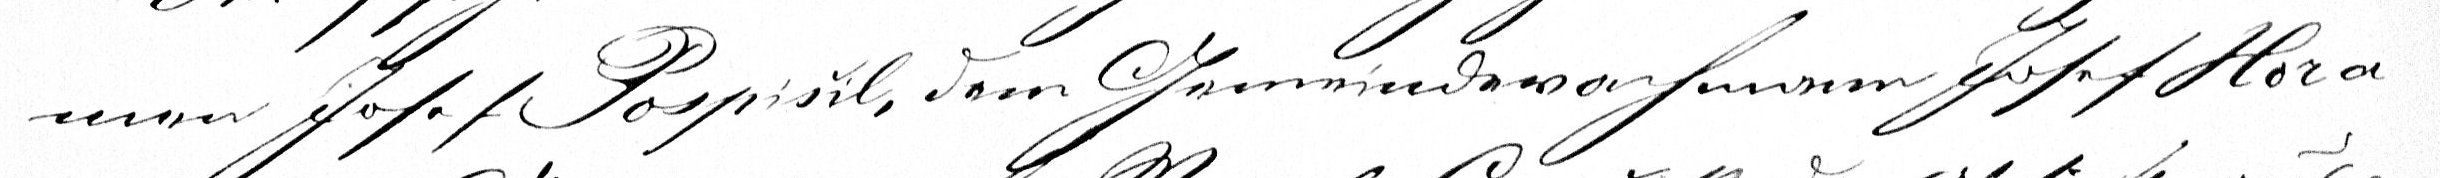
men Josef Pospisil, dem Gemeinde vorhmann Josef Hora
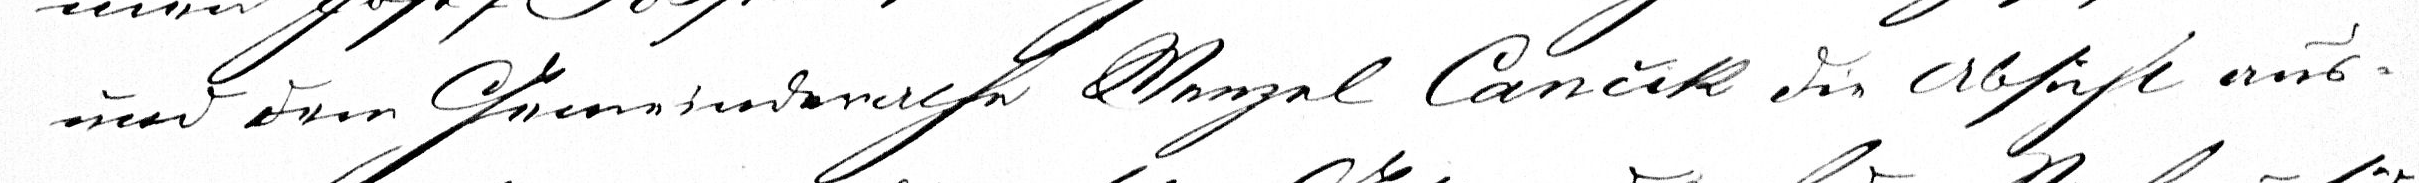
und dem Gemeinderache Wenzel Cancik die Absicht aus¬
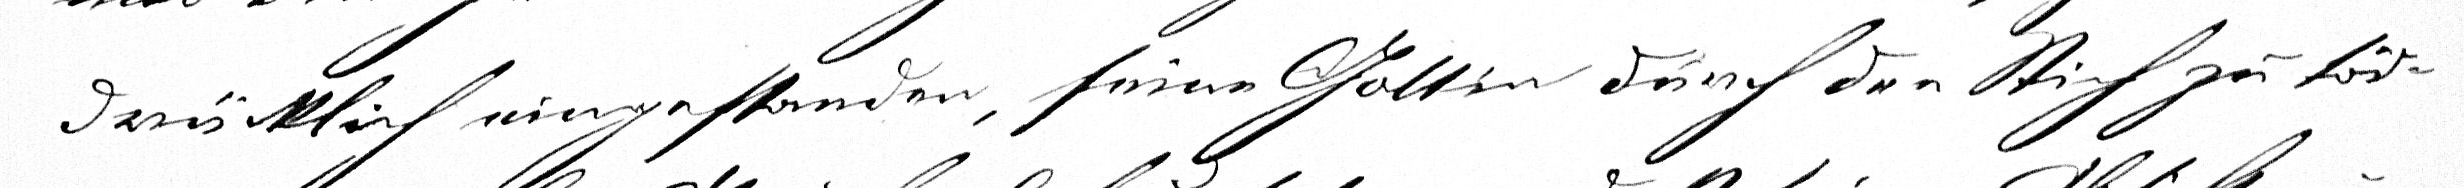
drücklich eingestanden, seine Gottin durch den Stich zu töd¬
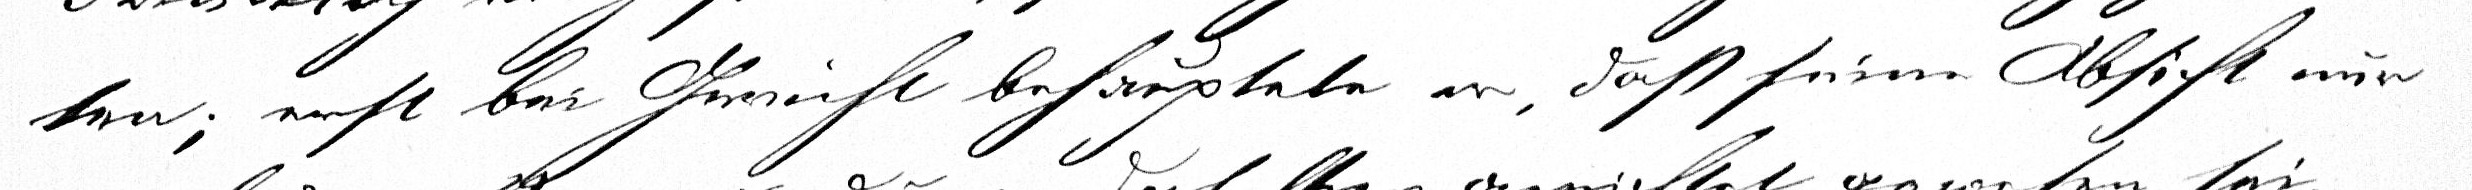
ten, erst bei Gericht behauptete er, daß seine Absicht nur
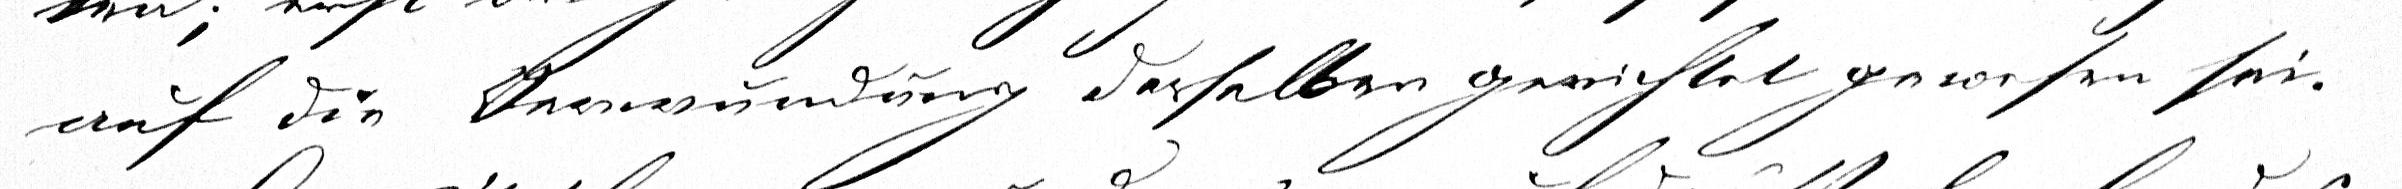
auf die Verwundung derselben gerichtet gewesen sei.
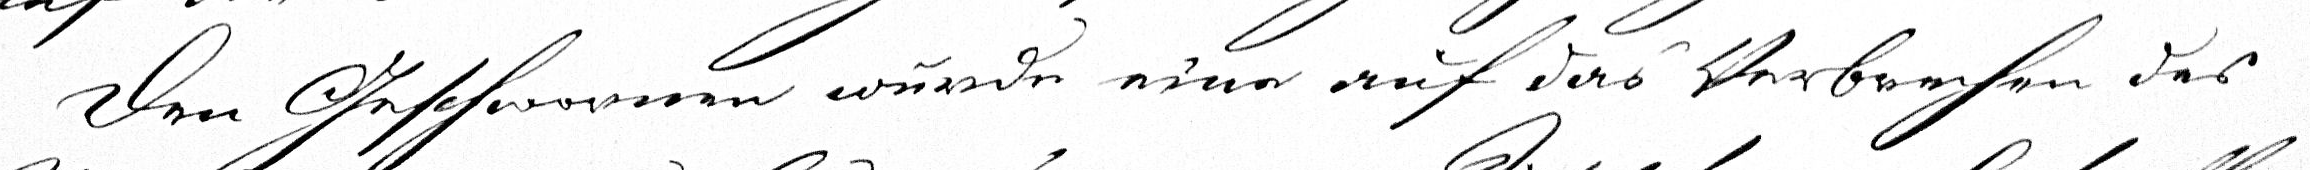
Den geschwornen wurde eine auf das Verbrechen des
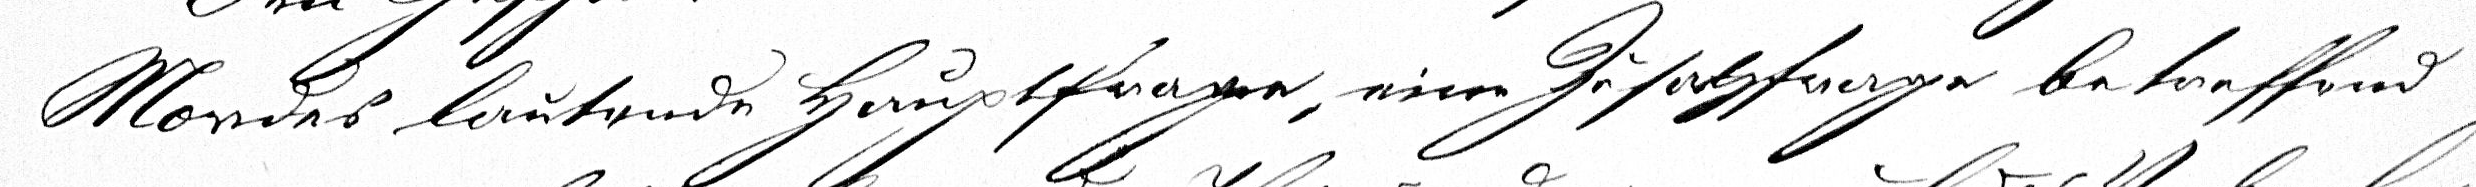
Mordes lautende Hauptfrage, eine Zusatzfrage betreffend
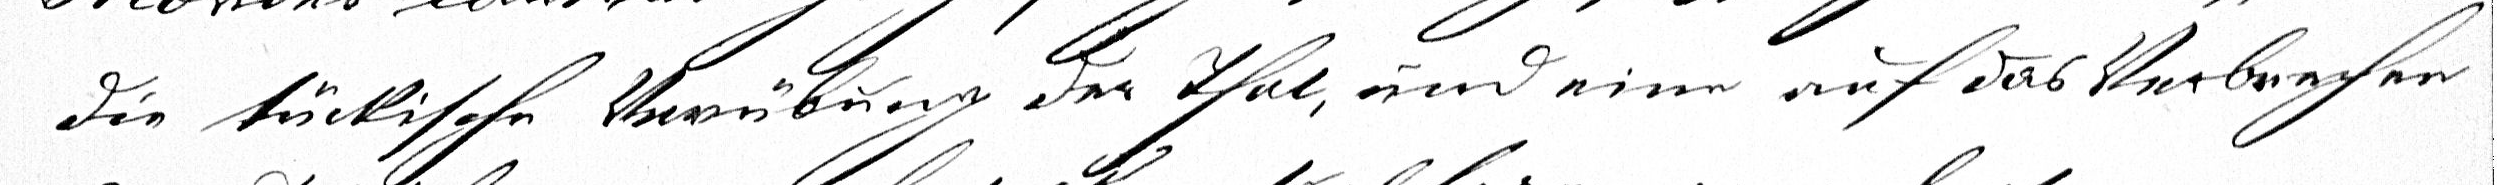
die tückische Verübung der That, und eine auf das Verbrechen
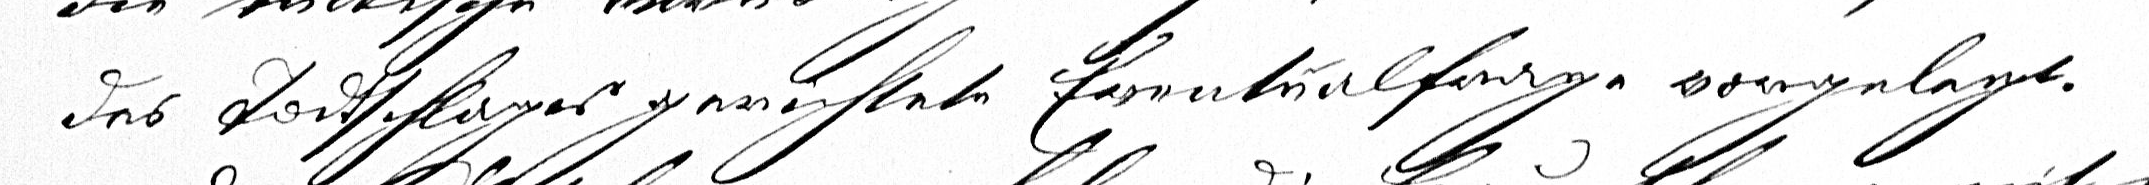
des Todtschlages gerichtete Ewentualfrage vorgelegt.
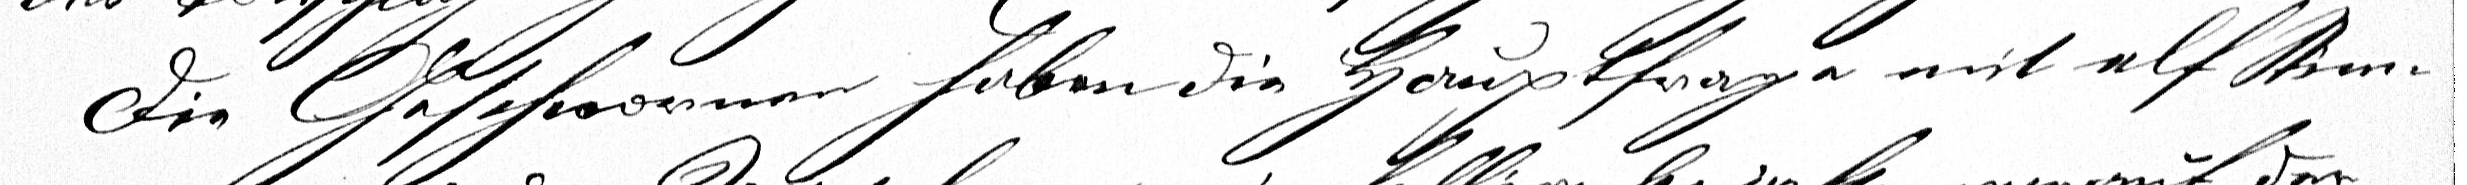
Die Geschwornen haben die Hauptfrage mit elf Stim¬
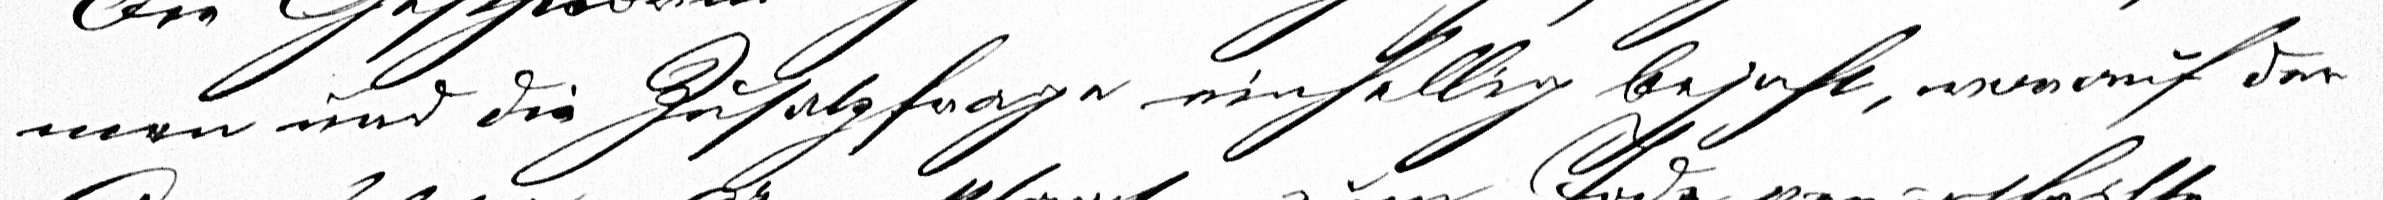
men und die Zusatzfrage einhellig bejaht, worauf der
